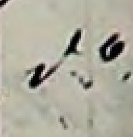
Do
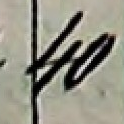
40
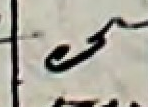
5
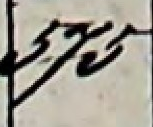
575
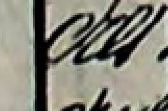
Alt
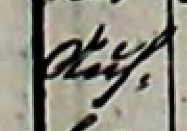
Aus„
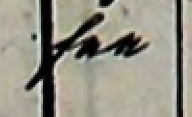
see
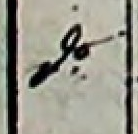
Do Do
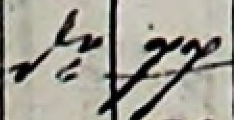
77
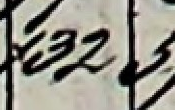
132
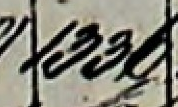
1336/
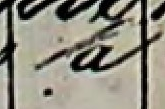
a
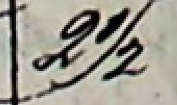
2 1/2
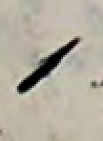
1
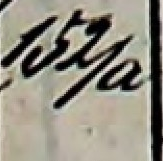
152/a
